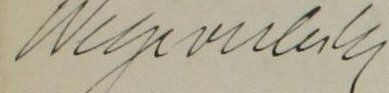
Wegeverteilung
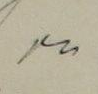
in
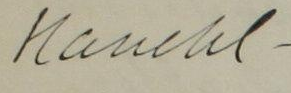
Hanehl
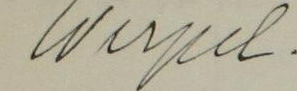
Werpel
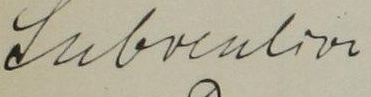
Subvention
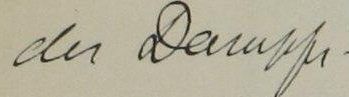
der Dampfer
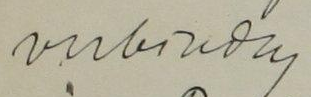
verbindung
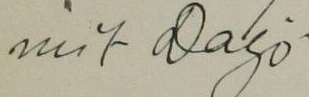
mit Dagö
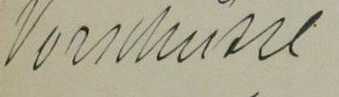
Vorschüsse
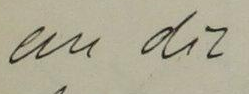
an die
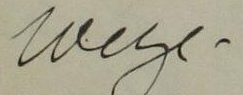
Wege-
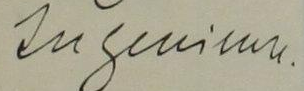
Ingenieure
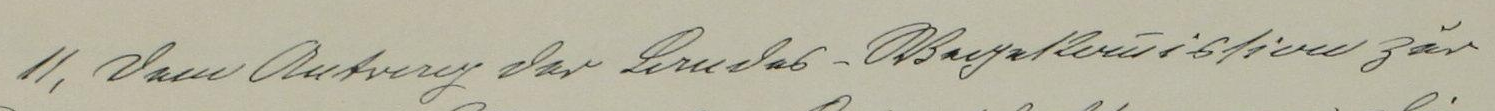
11. Dem Antrag der Landes-Wegekommission zur
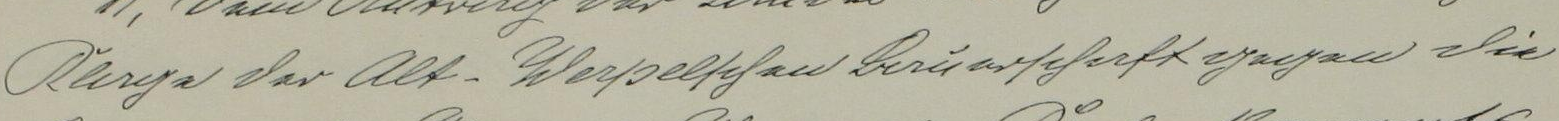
Klage der Alt-Werpelschen Bauerschaft gegen die
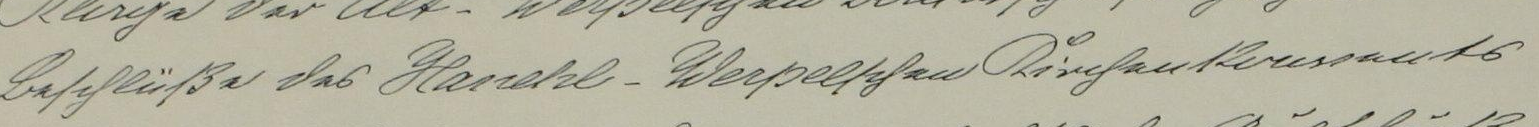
Beschlüße des Hanehl-Werpelschen Kirchenkonvents
